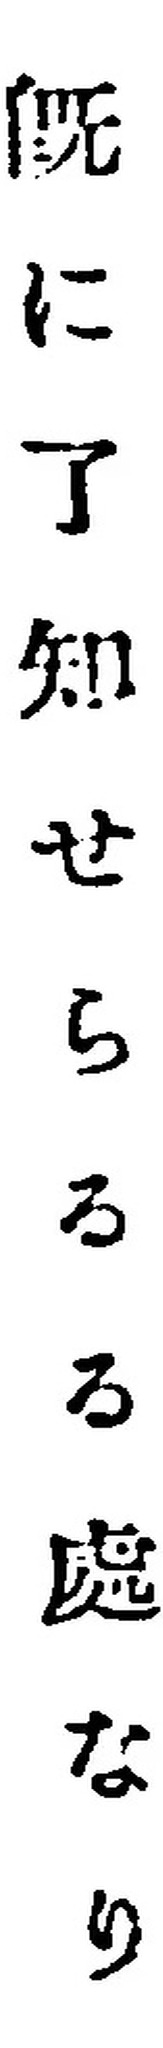既に了知せらるる処なり
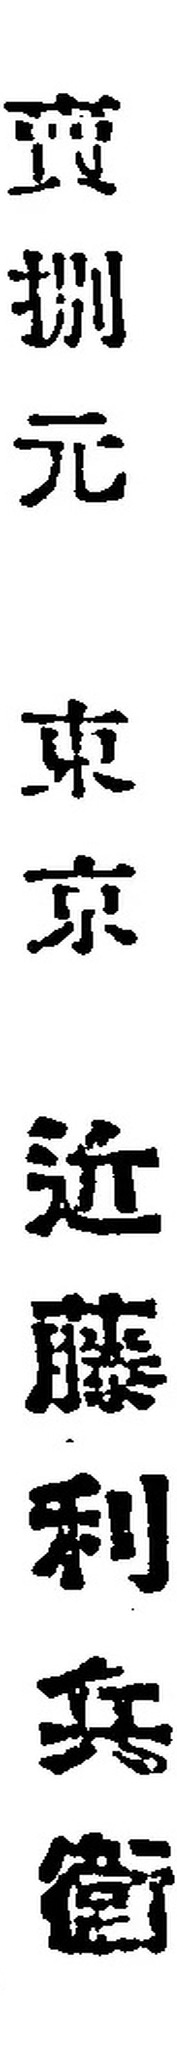売捌元東京近藤利兵衛
